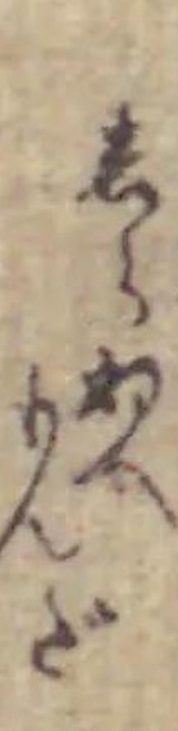しらねへ
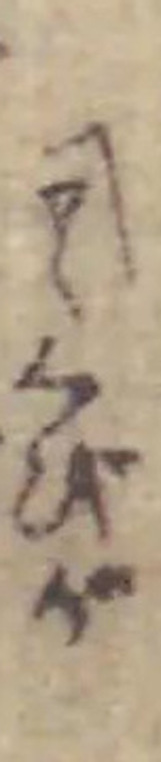〽アヽくびが
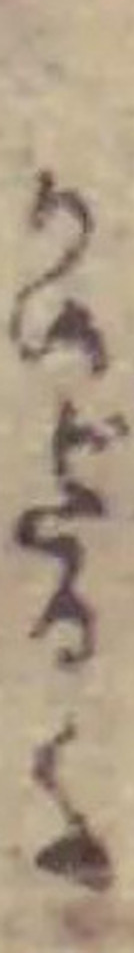かいだるく
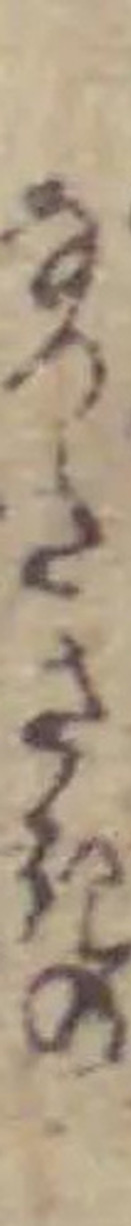なつたさきの
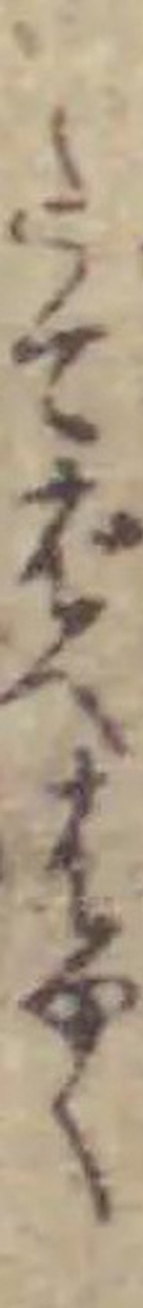たてばへはやく
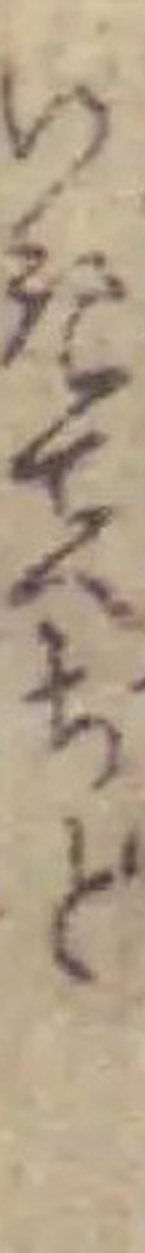いきてへちと
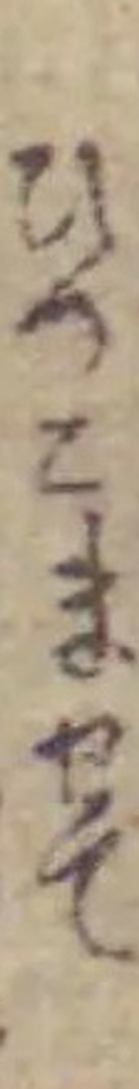ひつこませて
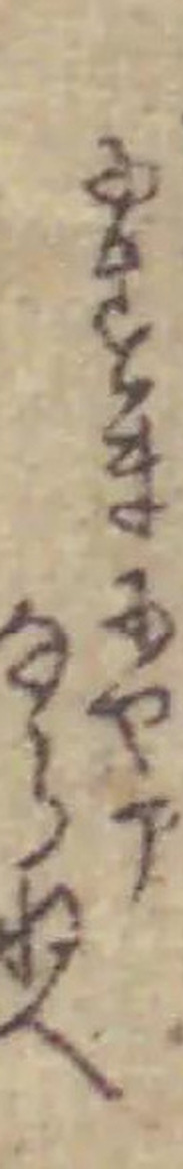やすまにやァ
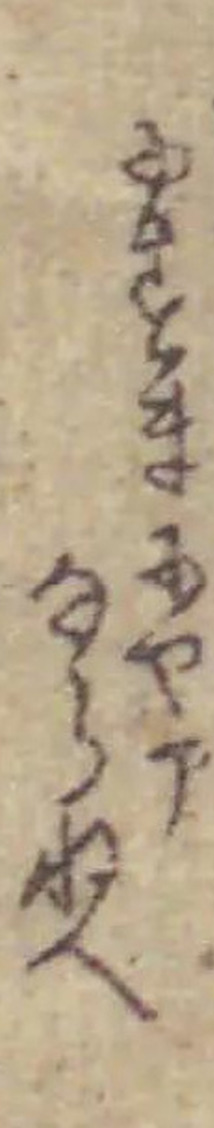ならねへ
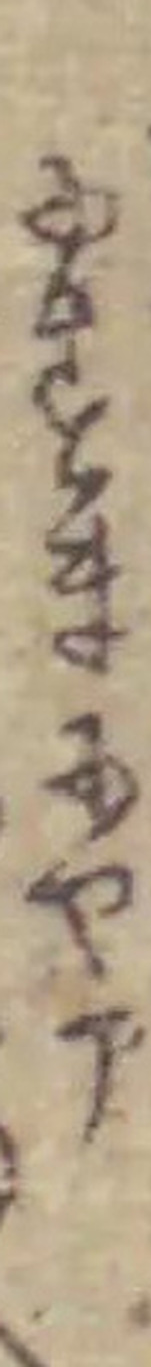やすまにやァ
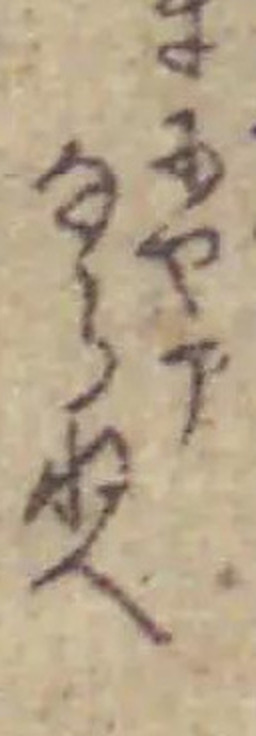ならねへ

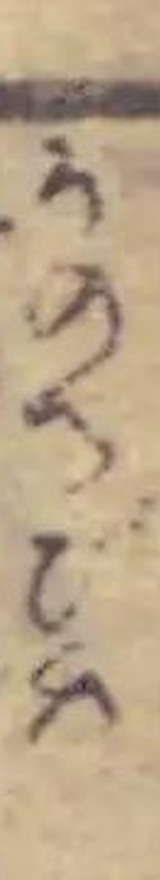かのへびは
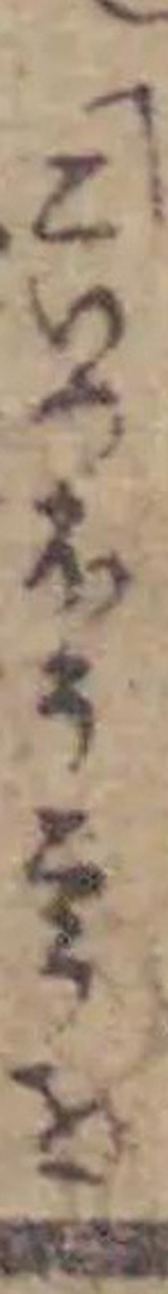〽こいつほうこうを
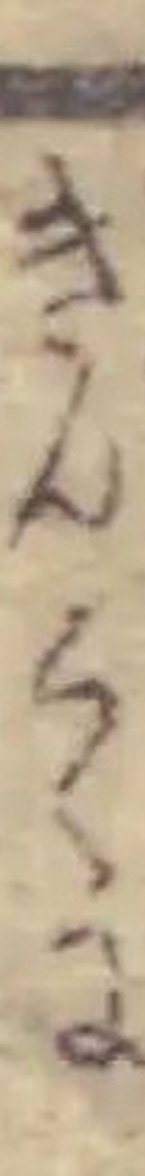きんこくに
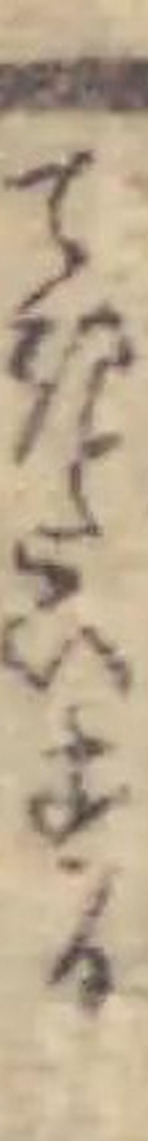てきたいある
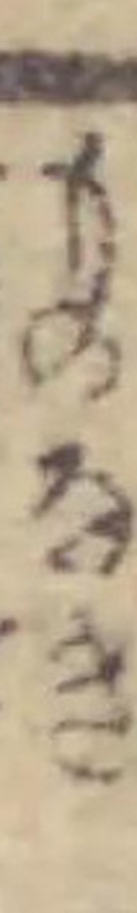ものなき
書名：化物太平記 3巻
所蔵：国立国会図書館 National Diet Library, JAPAN
